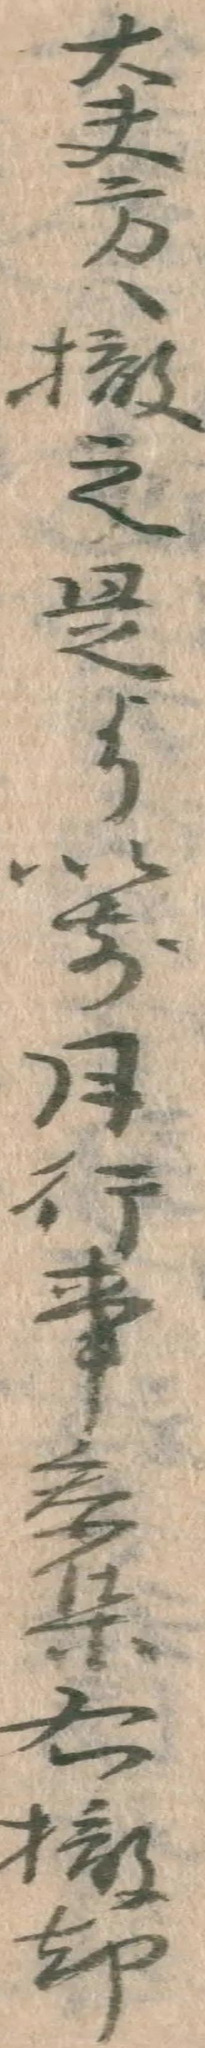大夫方へ撒之、是より以前月行事参集、右撒却
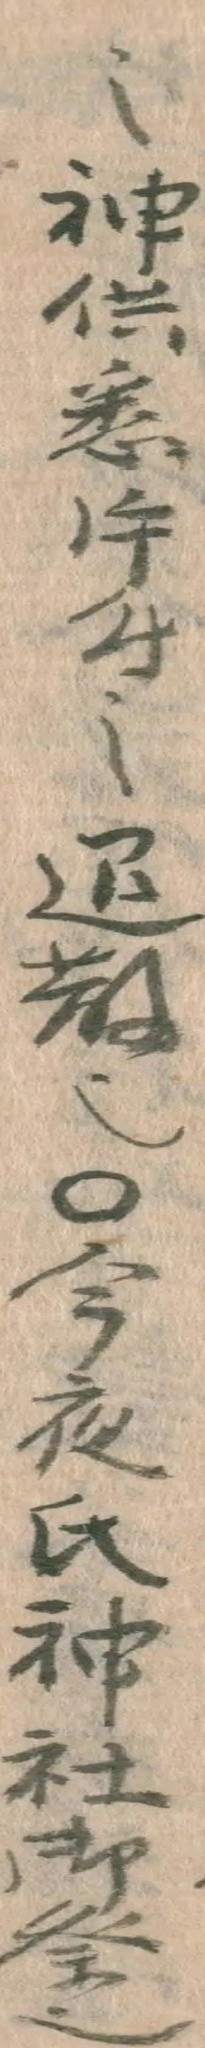之神供悉片付之退散也、○今夜氏神社御祭也、
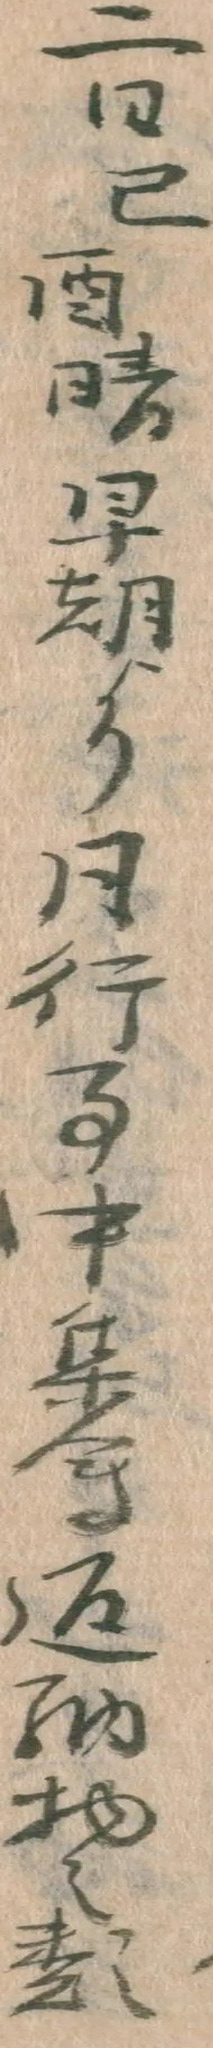二日己酉晴、早朝より月行事中集會返納物之類
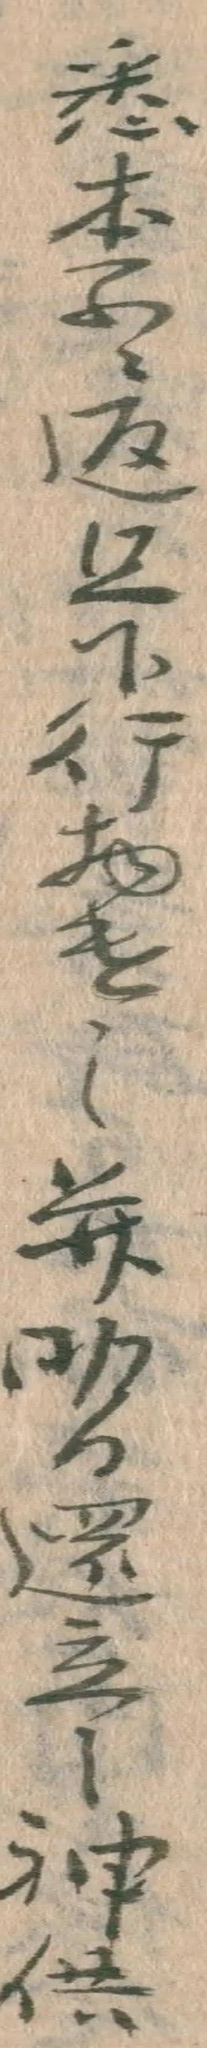悉本品に返、旦下行物遣之、并昨日還立之神供
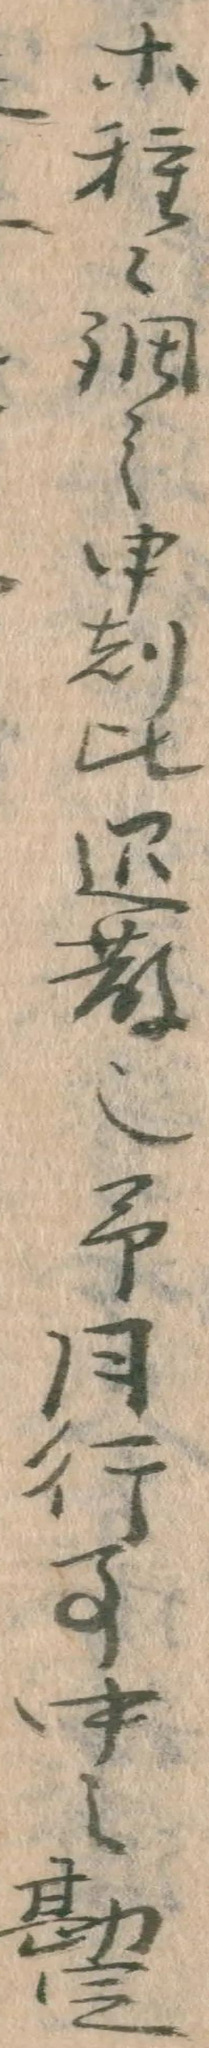等種〻調之、申刻比退散也、予月行事中之勘定
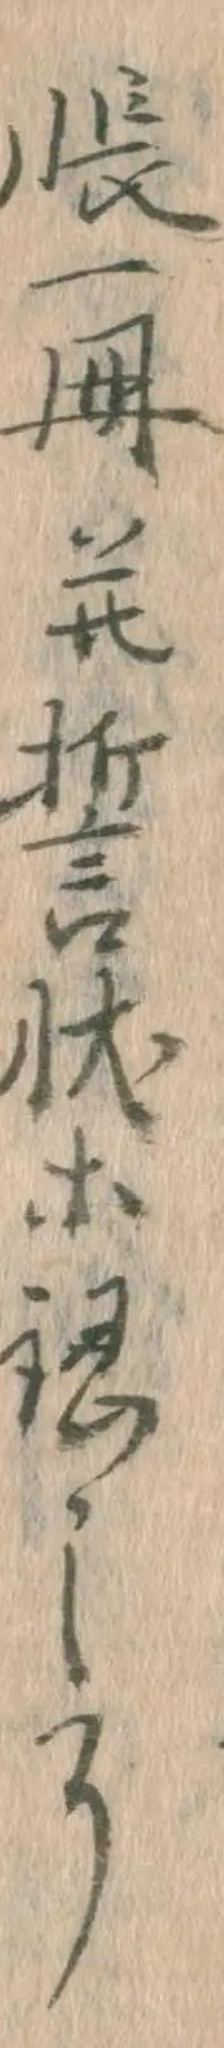帳一冊并誓状等認之了、
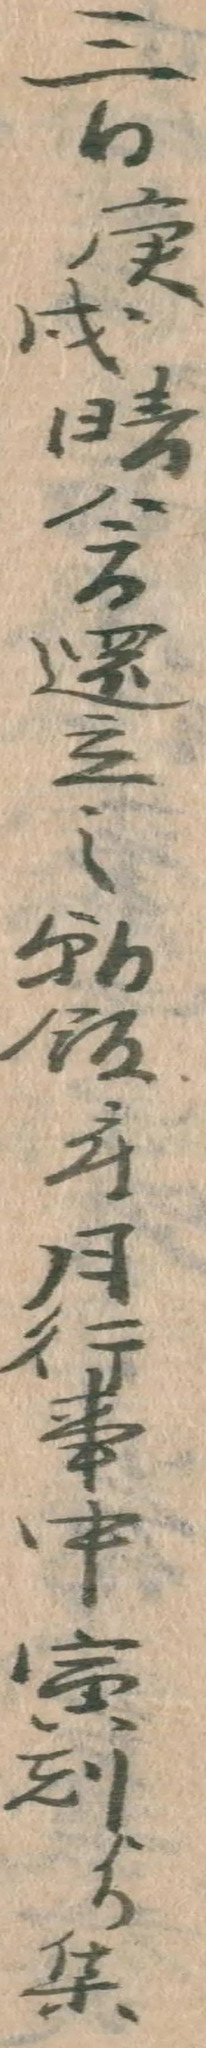三日庚戌晴、今日還立之朝飯ニ付、月行事中寅刻より集
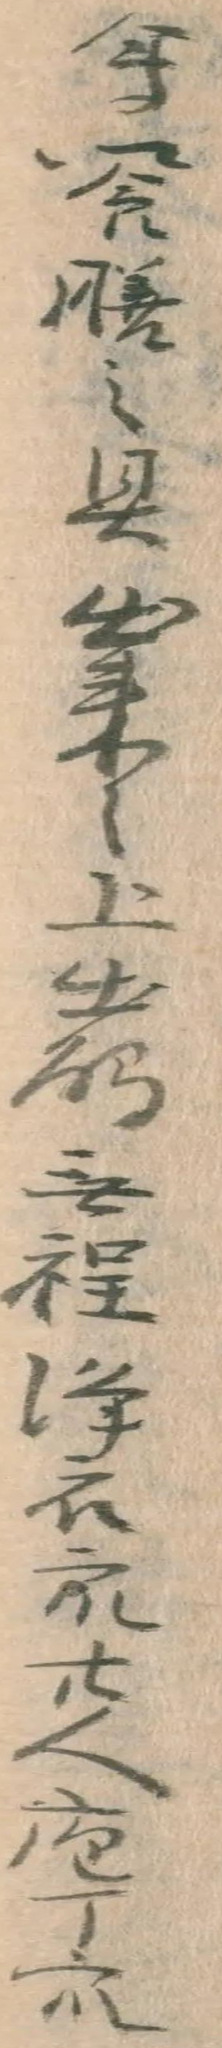會、膳之具出来之上、出触無程浄衣衆廿人、庖丁衆
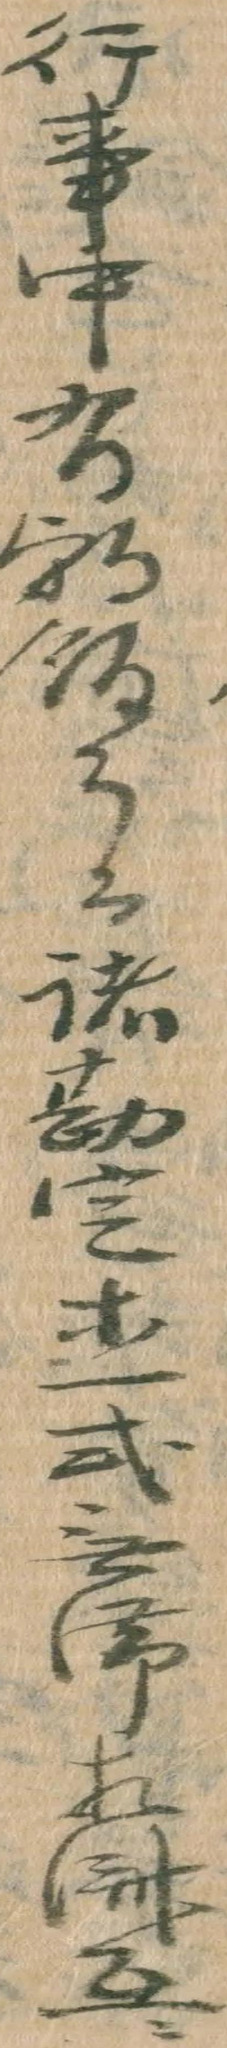行事中有朝飯ニ而、諸勘定等一式無滞相済、互ニ
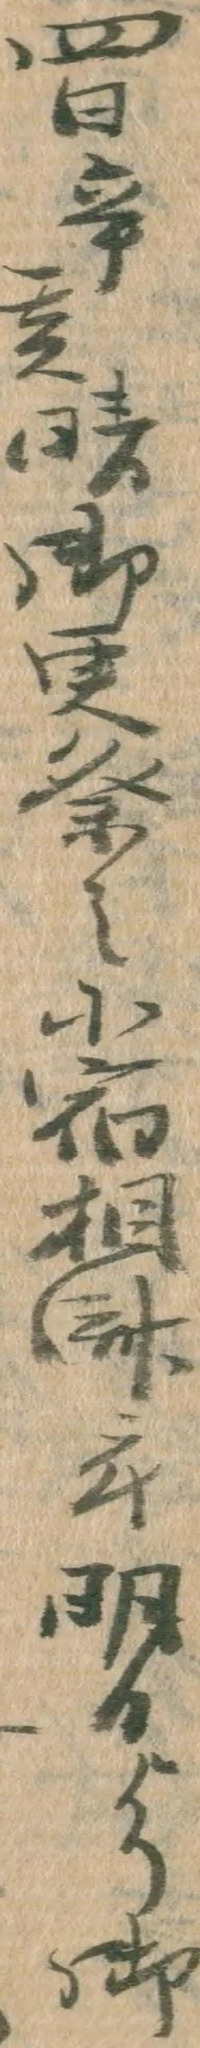四日辛亥晴、御更祭之小宿相ニ付、明日より御
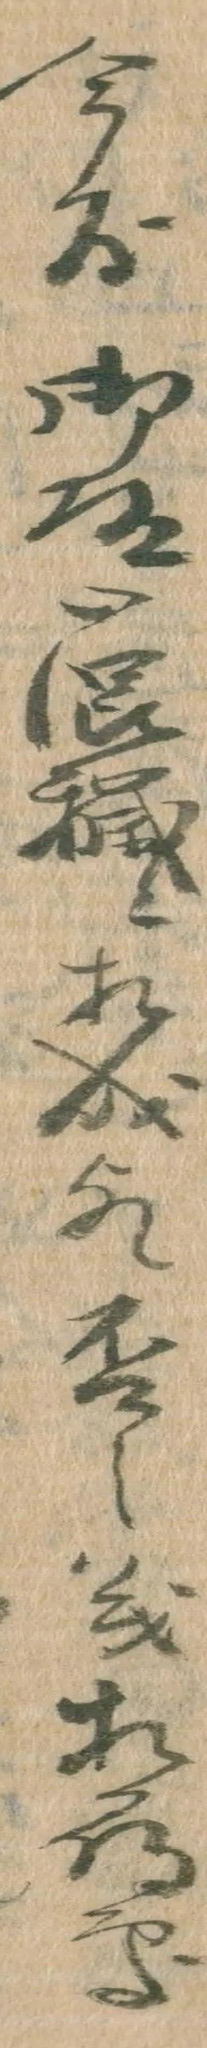今度御賄御混穢ニ相成歟否之義、相尋候處、
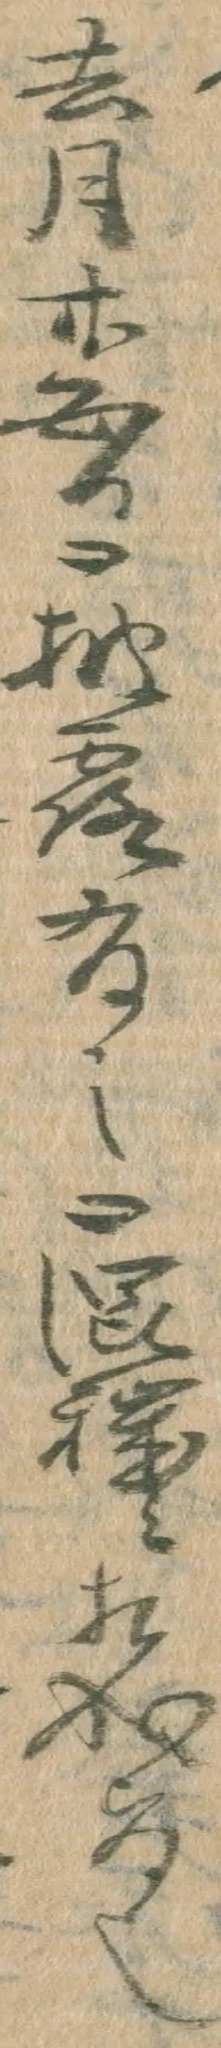去月廿五日御披露有之、混穢ニ相成有也、
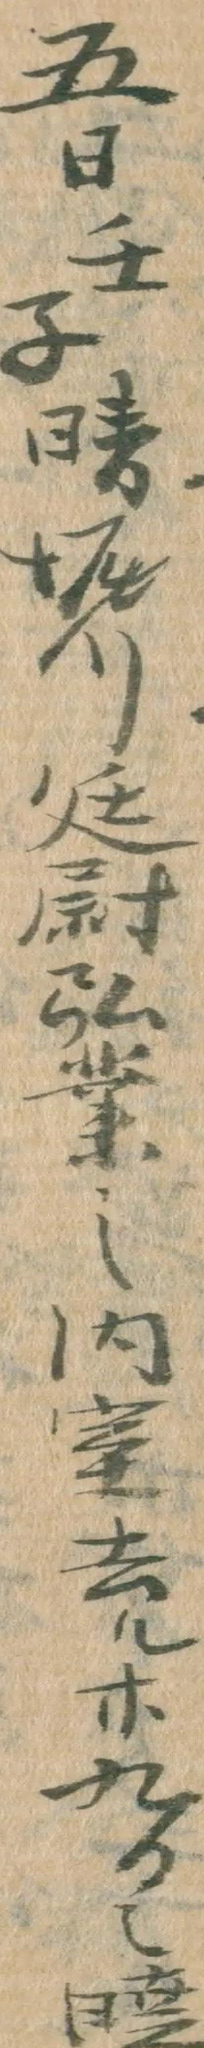五日壬子晴、堀川廷尉弘業之内室、去ル廿九日之暁
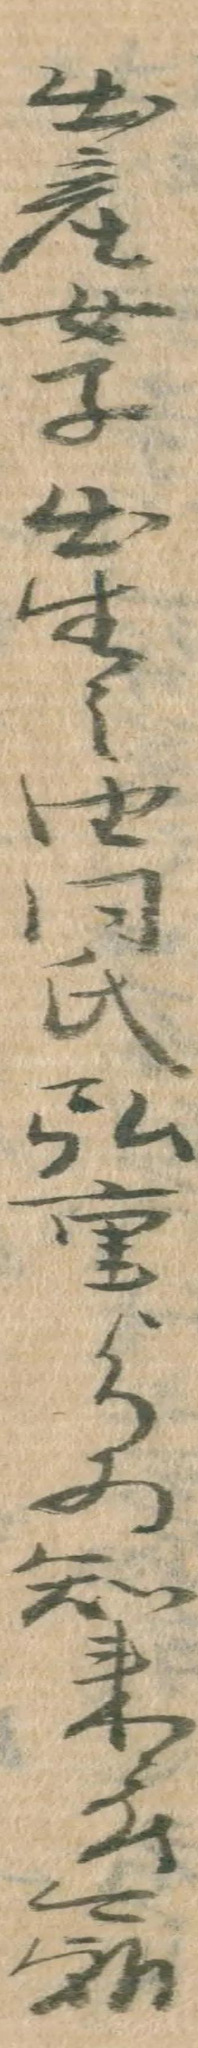出産、女子出生之由、同氏・弘重より為知来ニ付、可難
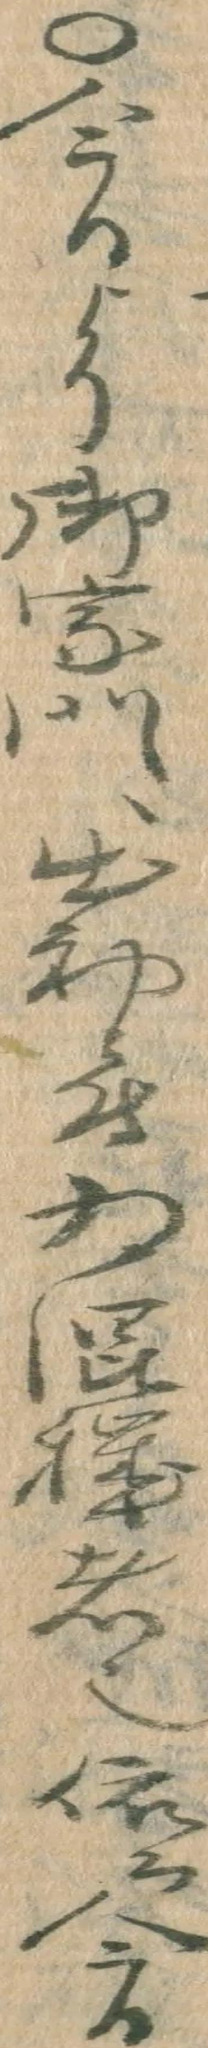○今日より御家門へ出勤ニ付、為混穢者也、依而今日
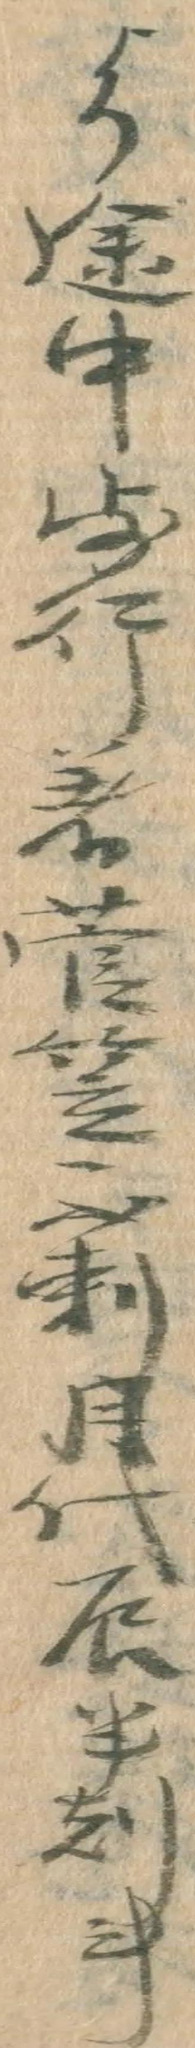より途中歩行着菅笠不刺月代辰半刻計
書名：賀茂社記録. 第63冊
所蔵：国立国会図書館 National Diet Library, JAPAN
